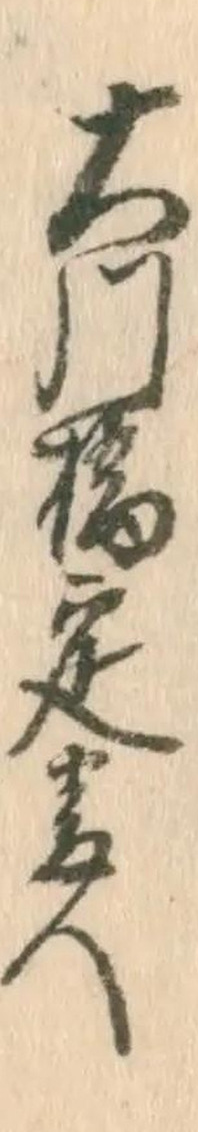大川橋定番人
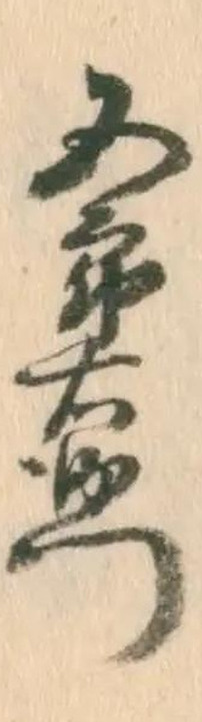五郎右衛門
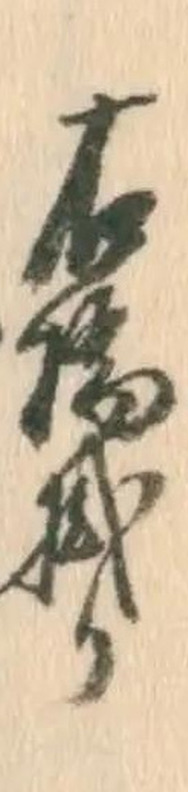右橋掛り
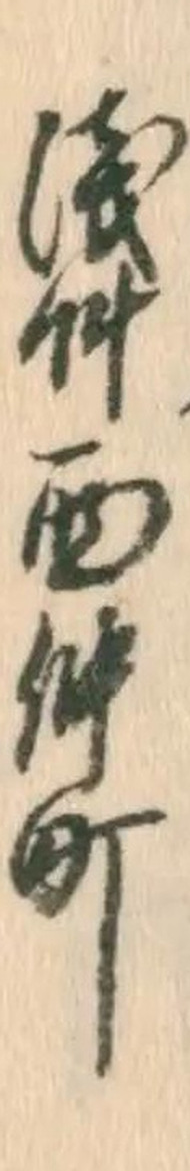浅草西仲町
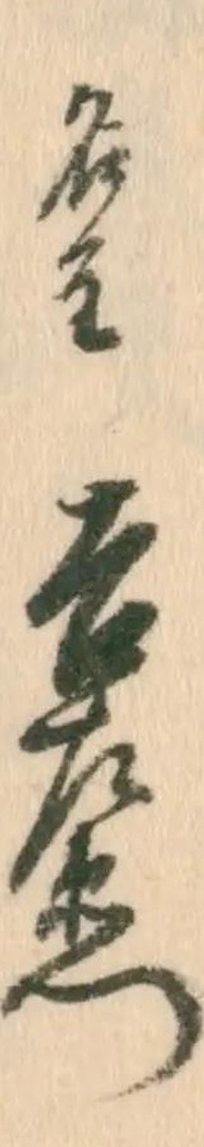名主吉左衛門
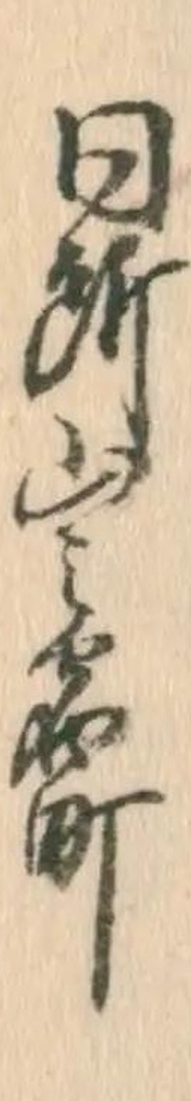同所山之宿町
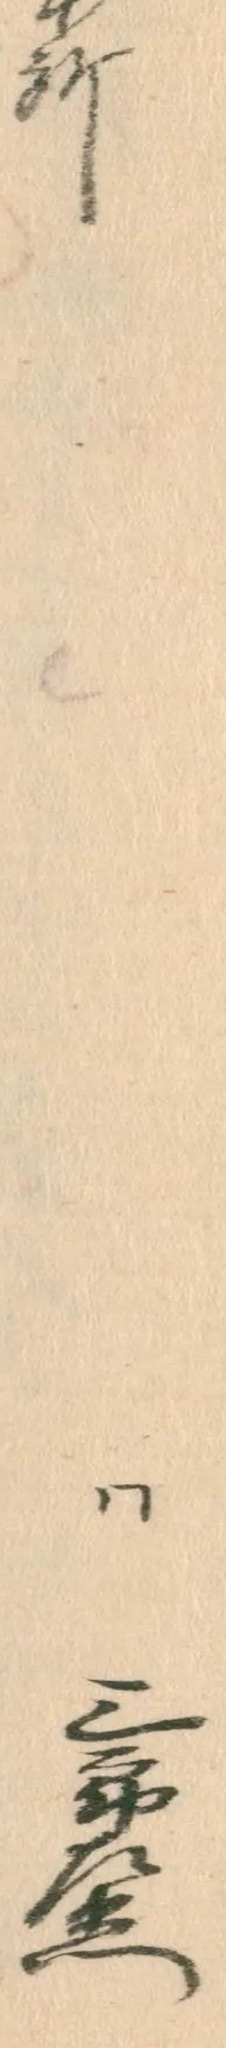同三郎左衛門
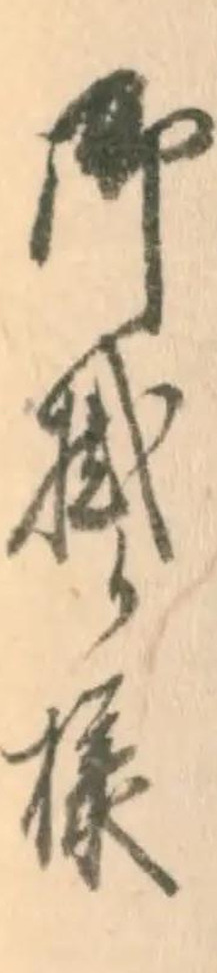御掛り様
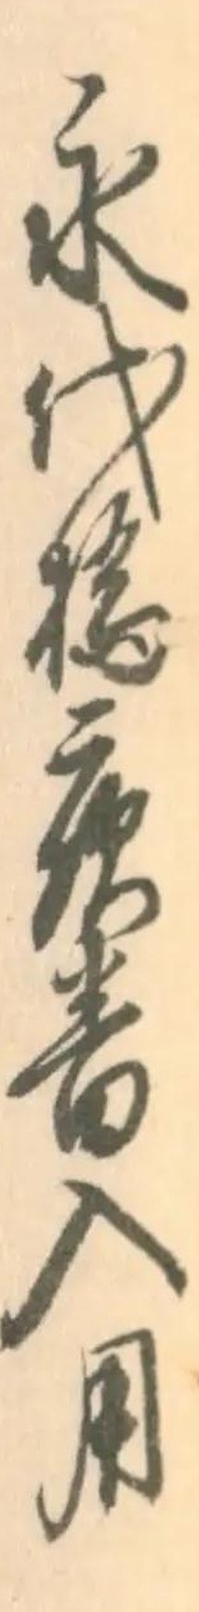永代橋夜番入用
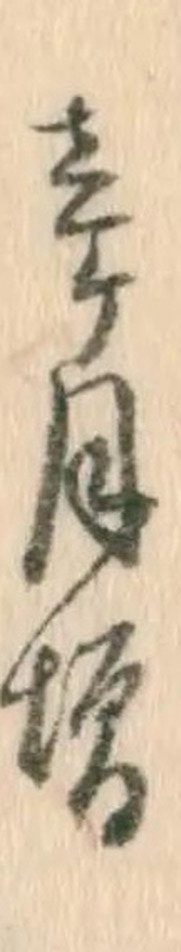壱ケ月増
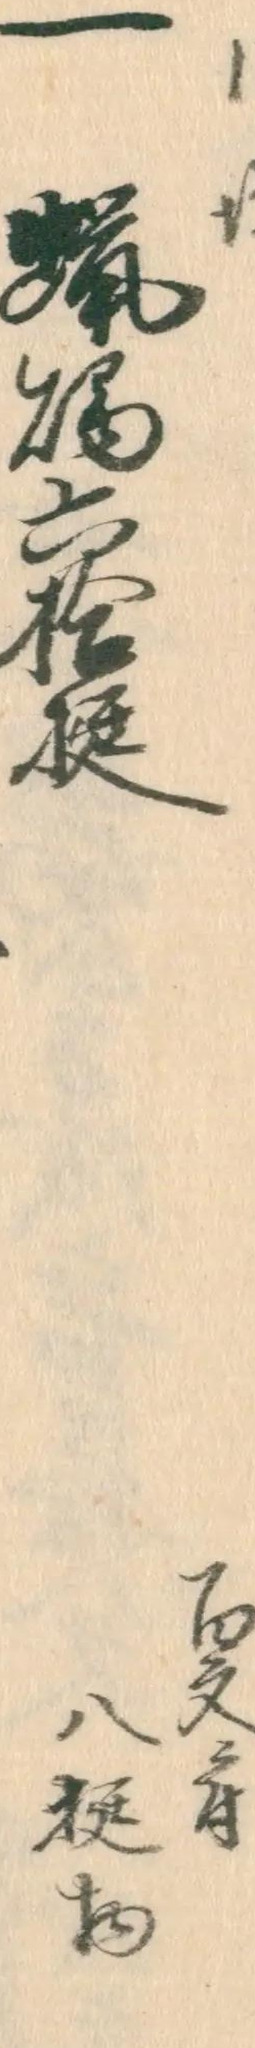一蝋燭六拾挺百文ニ付

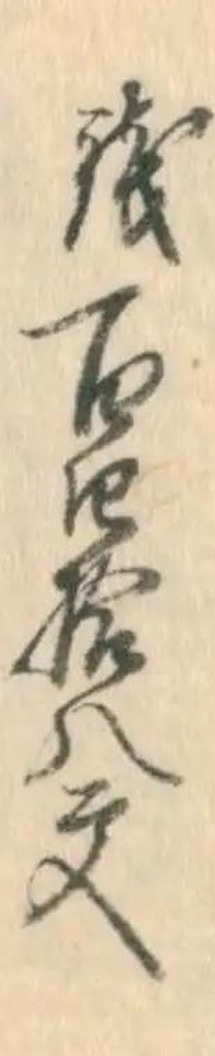銭百四拾八文
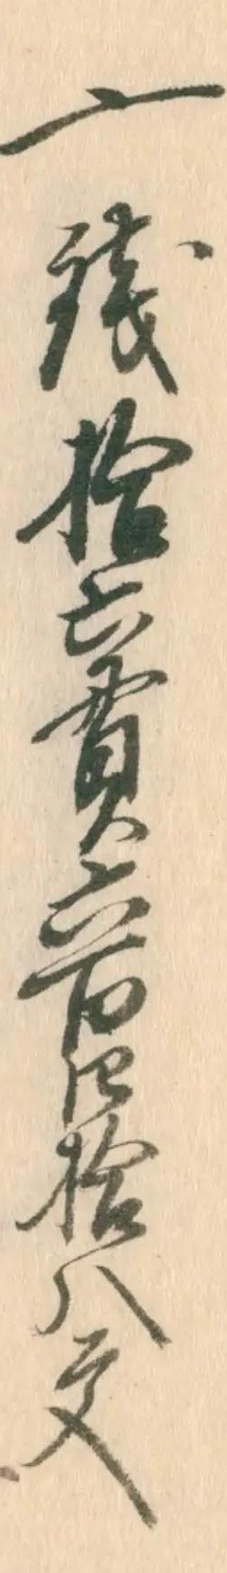〆銭拾六貫六百四拾八文
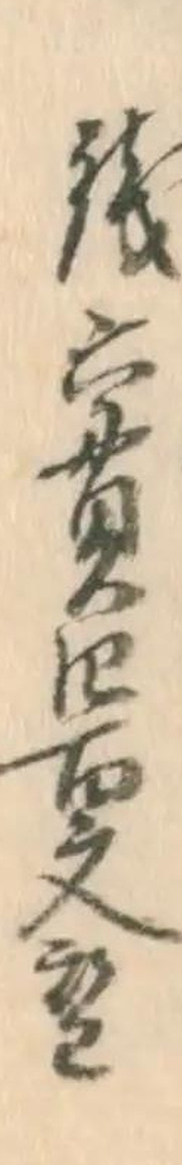銭六貫四百文替
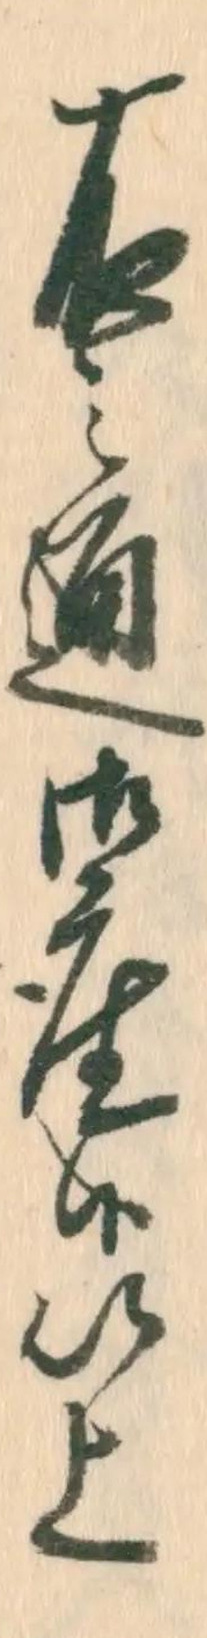右之通御座候以上
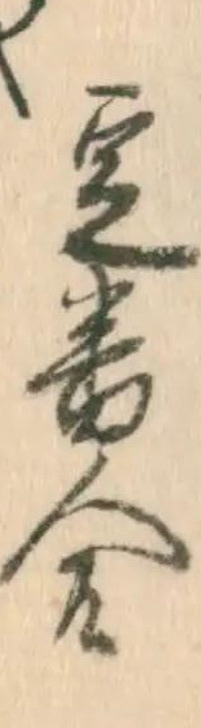定番人共
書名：三橋 17巻. [7] 三橋小破御修復書留　但御奉行御掛リ替地震潰橋番屋　嘉永四亥年より安政二卯年迄　上
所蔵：国立国会図書館 National Diet Library, JAPAN
